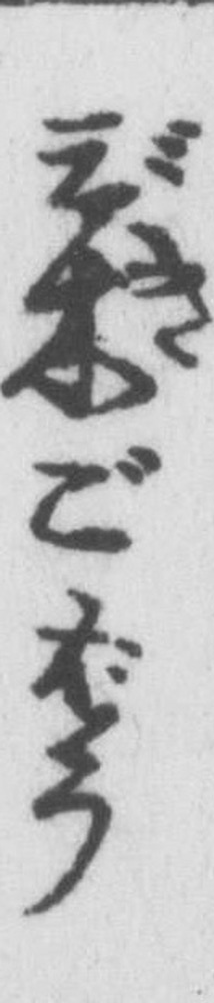三木ごばう
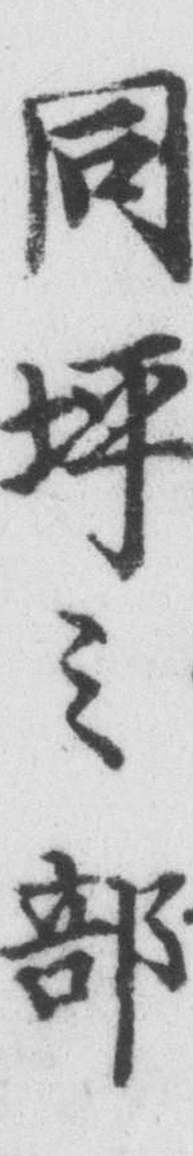同坪之部
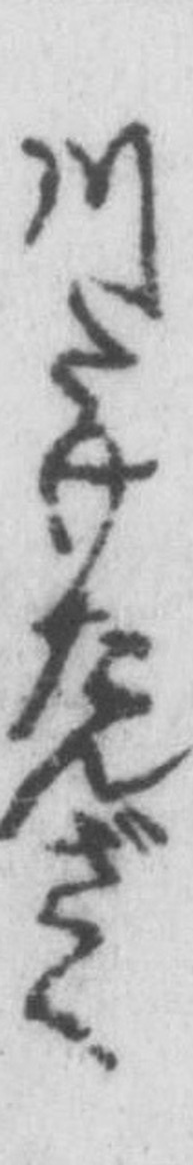川たけたんざく
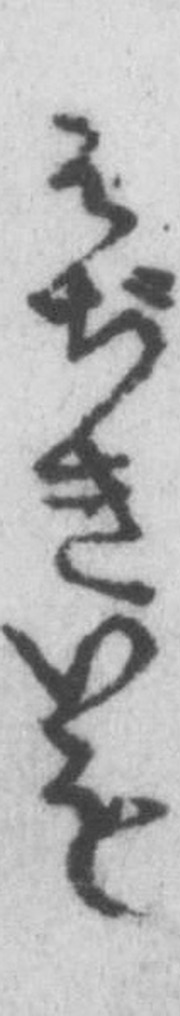はぢきまめ
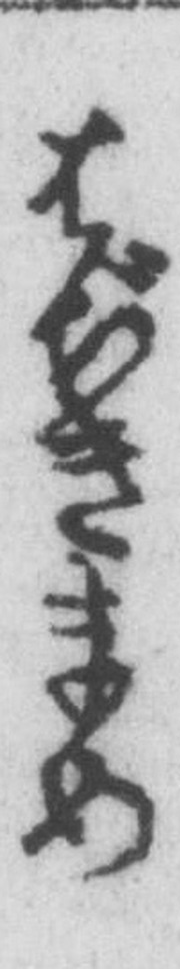はぢきまめ

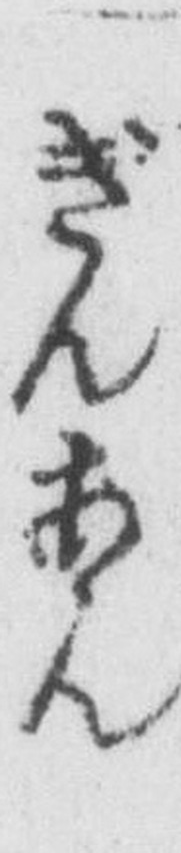ぎんあん
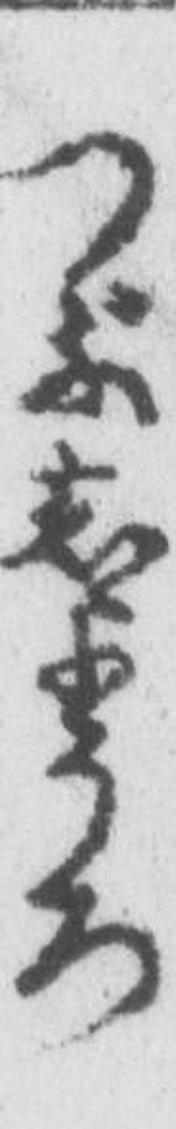つぶしやうろ
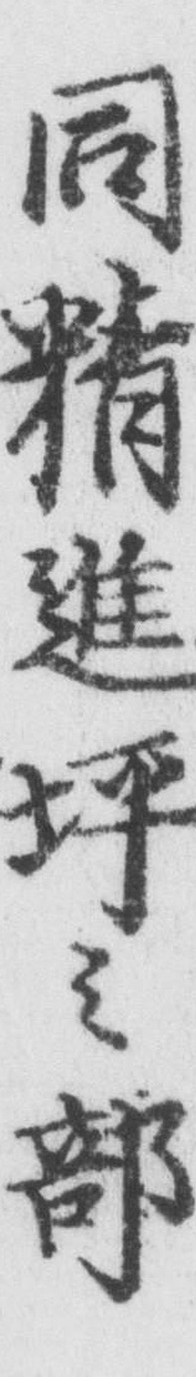同精進坪之部
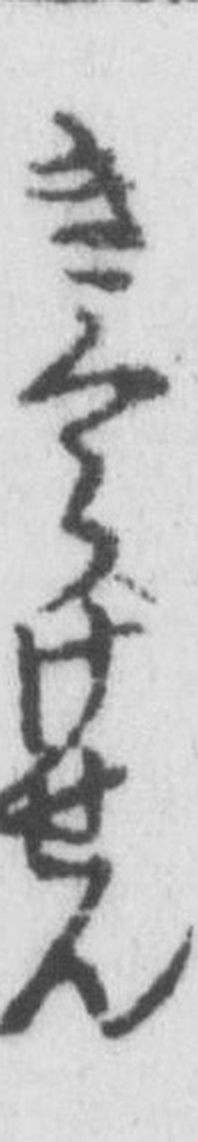きくらげせん
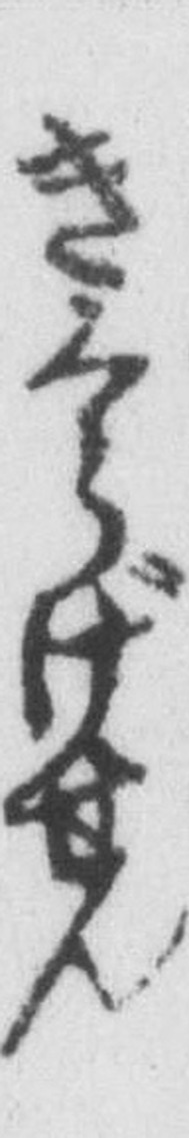きくらげせん
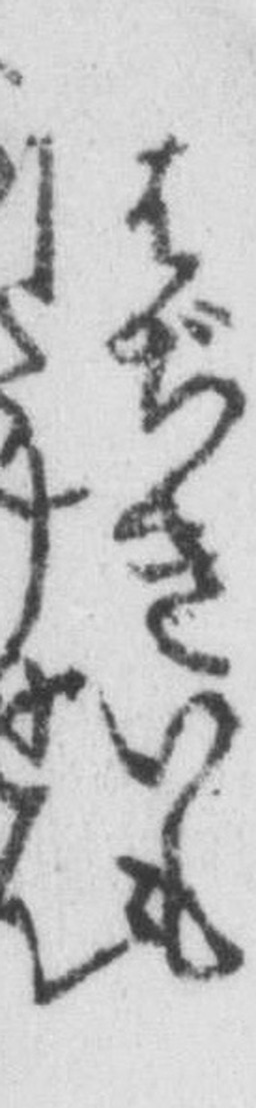川たけせん
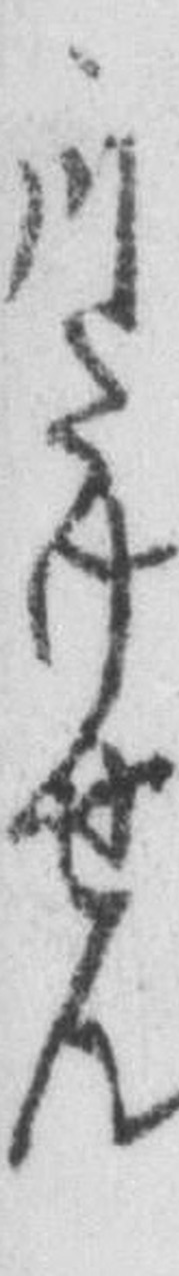川たけせん
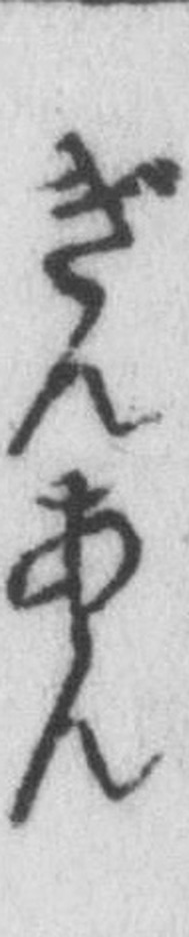ぎんあん
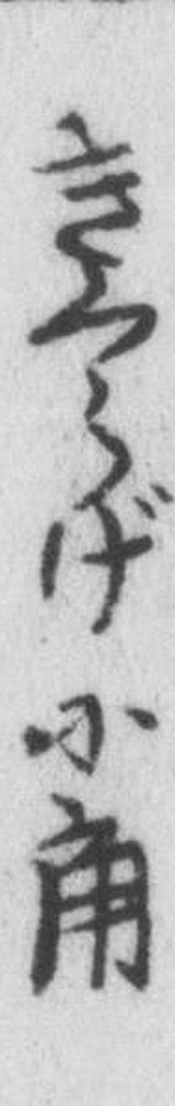きくらげせん
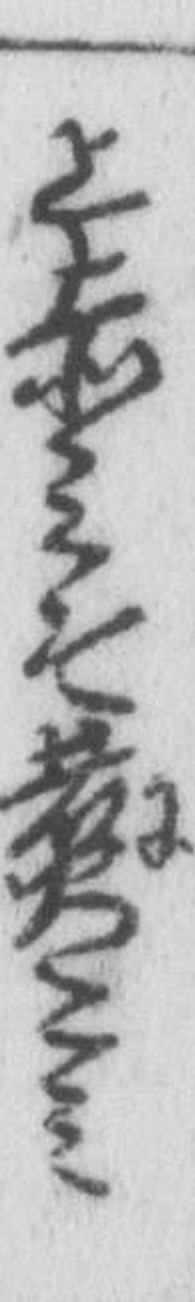上赤ミそ煮こミ
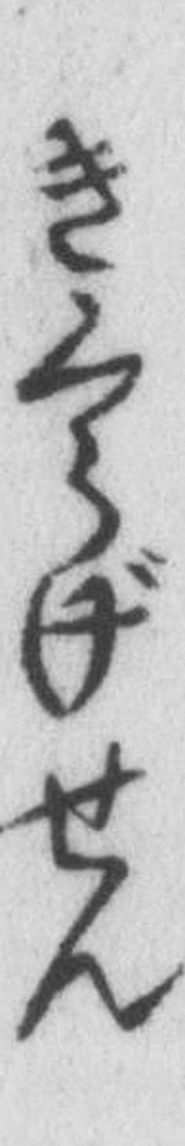きくらげせん
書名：当世料理献立
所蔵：大阪府立大学学術情報センター 国文学研究資料館
